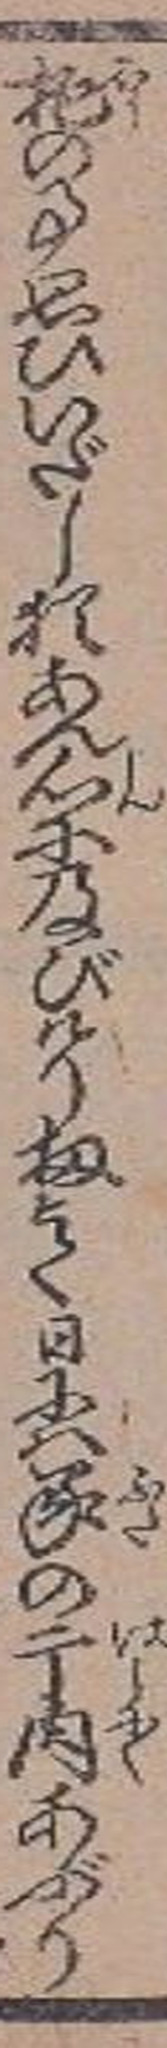抱の事思ひいだし猶あん心に及びけり扨よく日には豕の干肉あぶり
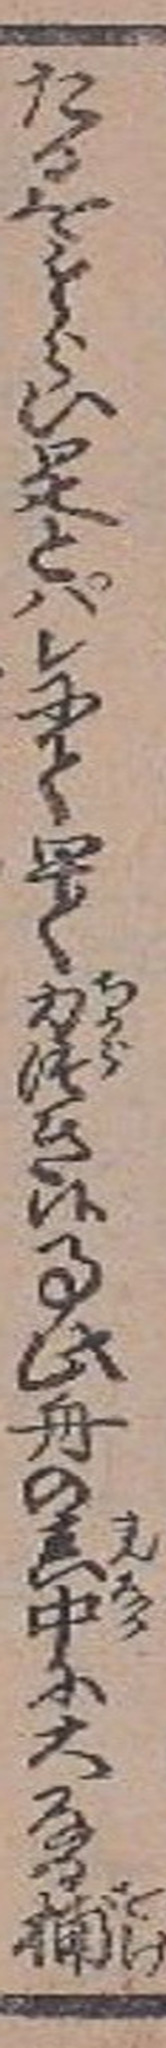たるをもらひ是とパンにて早〳〵力つき候事此舟の真中に大なる桶
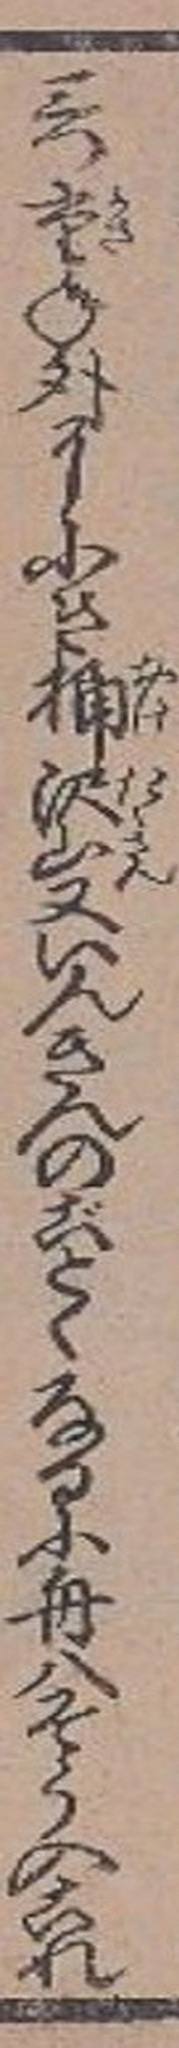三つ重ね外に小き桶沢山又いんきんのごとくなる小舟八そう入これ

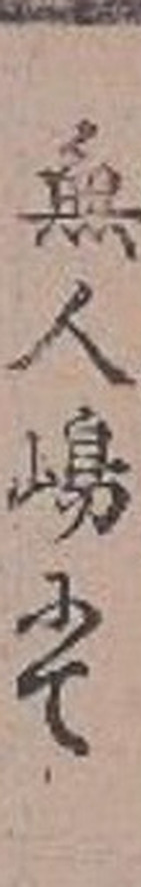無人嶋にて
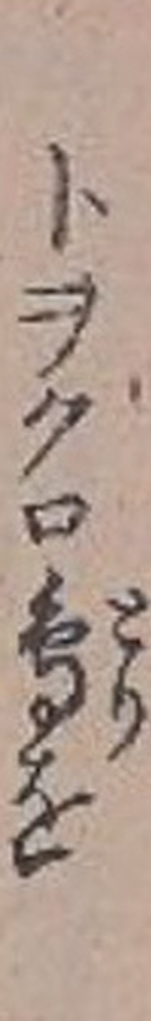トヲクロ鳥を
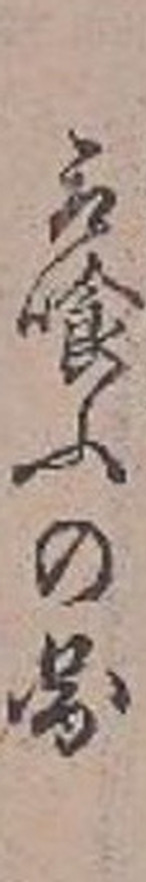取喰ふの図

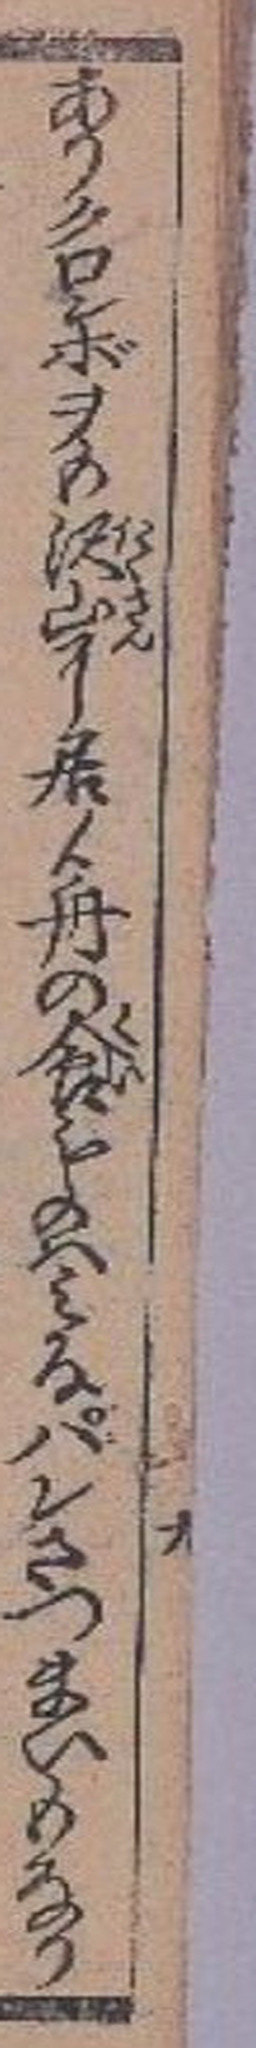ありクロンボヲも沢山に居候舟の食ものはみなパンさつまいもなり
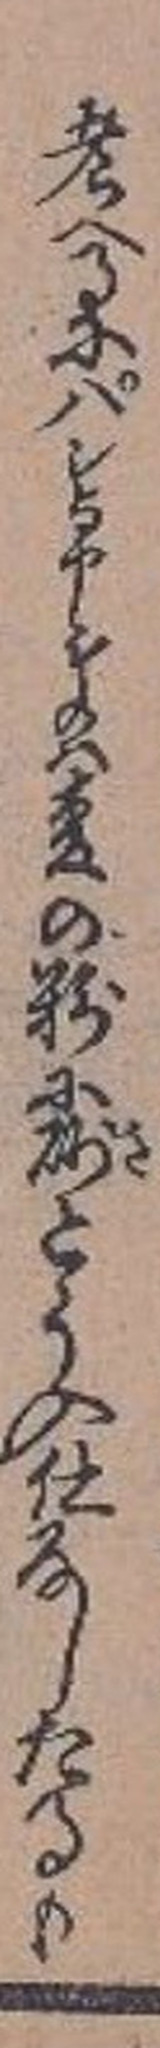考へるにパンと申ものは麦の粉に砂とう入仕なしたるも
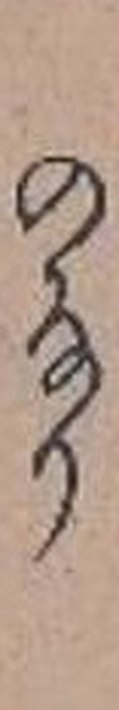のなり
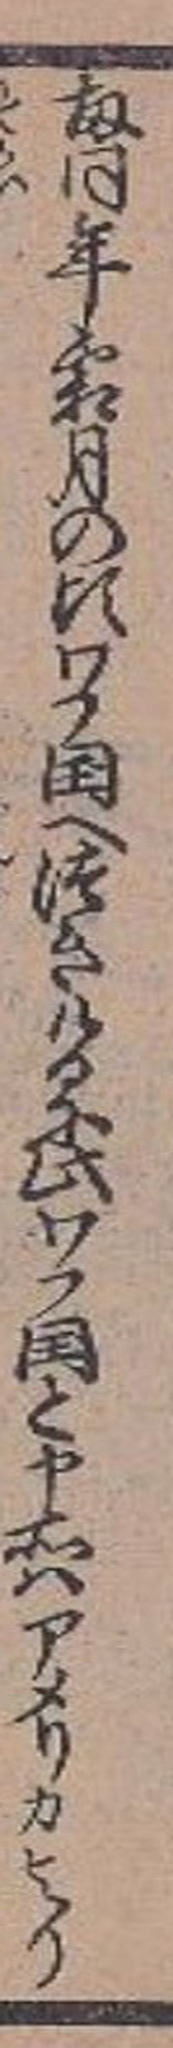扨同年霜月の頃ワフ国へつきけるに此ワフ国と申所はアメリカより
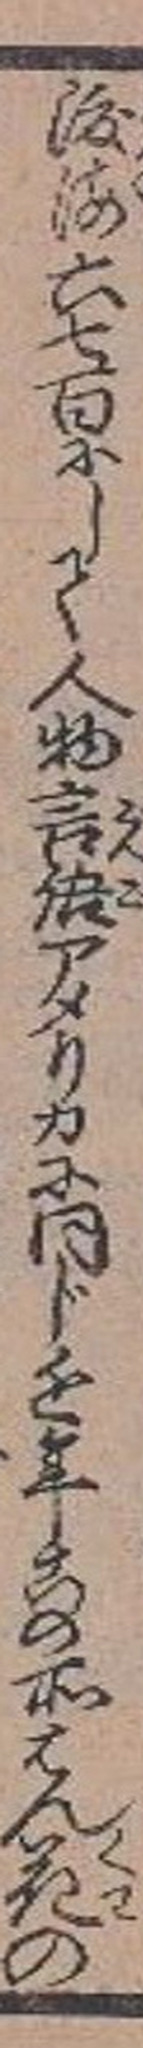渡海六七百にして人物言語アメリカに同じ近年この所はん花の
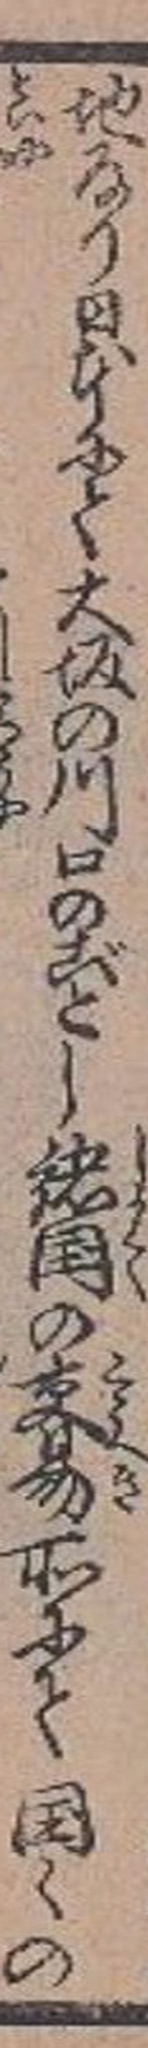地なり日本にて大坂の川口のごとし諸国の交易所にて国々の
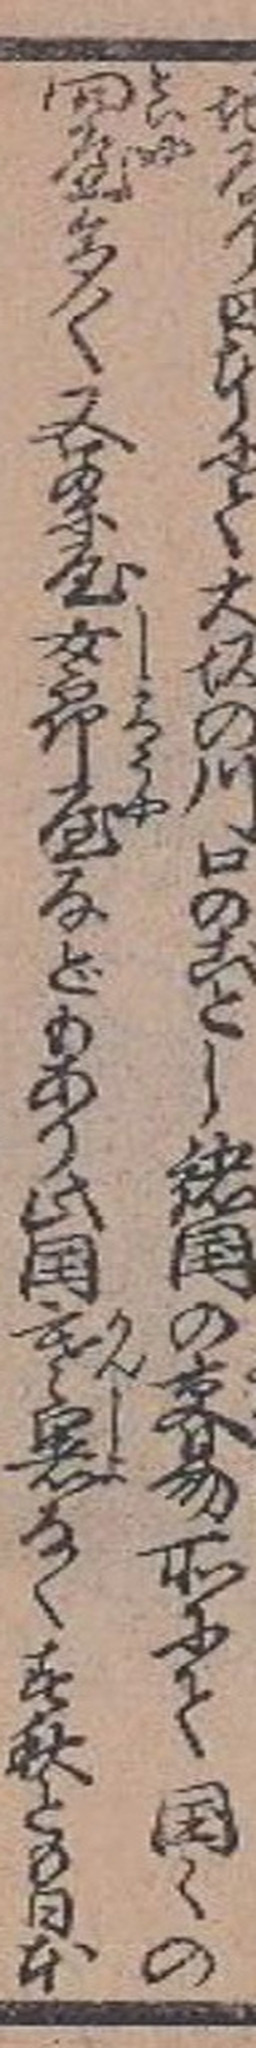問屋多く又茶屋女郎屋などもあり此国寒暑なく春秋とも日本
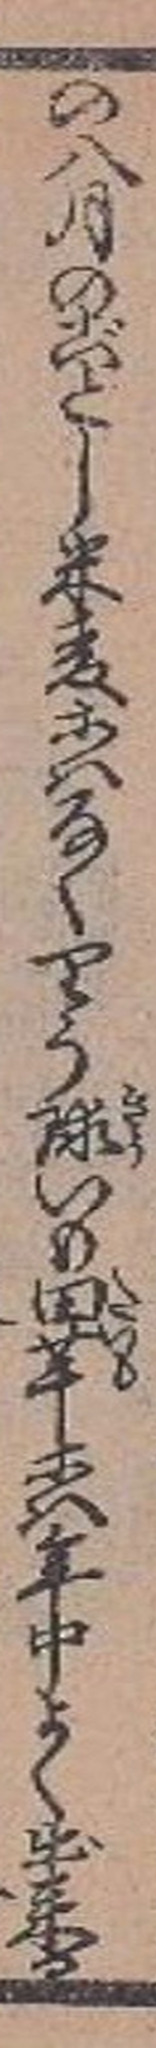の八月のごとし米麦等はなくりう球いも田芋等は年中よく出来る
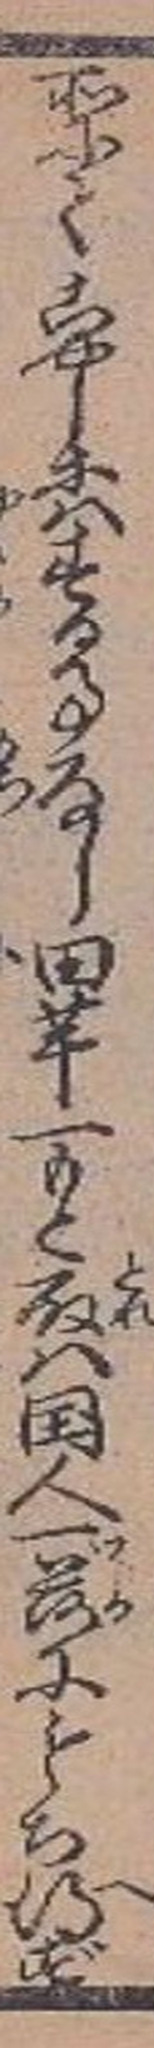所にてこやし等はする事なし田芋一もと取は国人一ツ荷にもち得ず
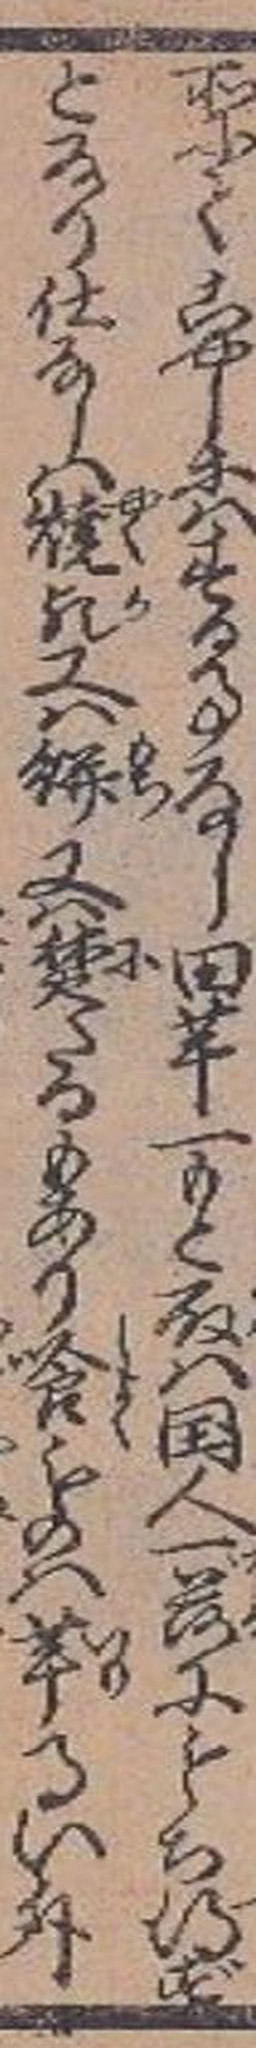となり仕なしは焼歟又は餅又は焚たるもあり喰ものは芋るい外
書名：満次郎漂流記
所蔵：University of the Ryukyus Library
